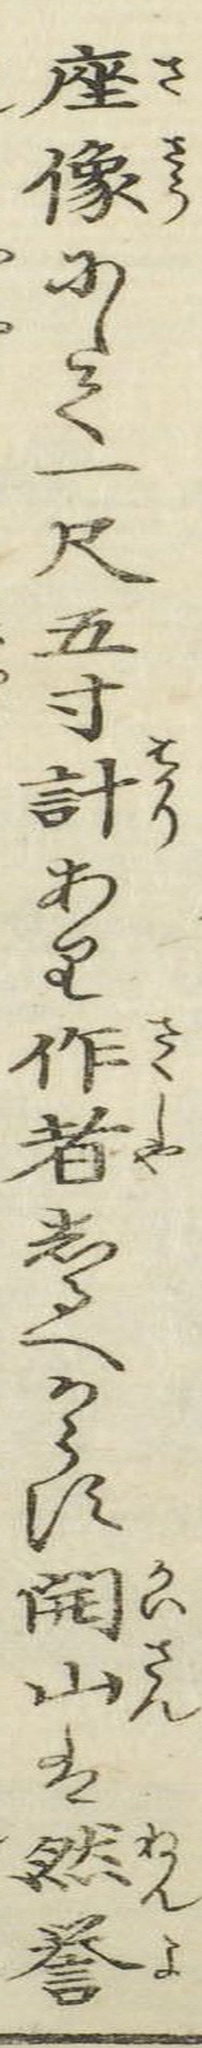座像にして一尺五寸計あり作者しるへからす開山は然誉
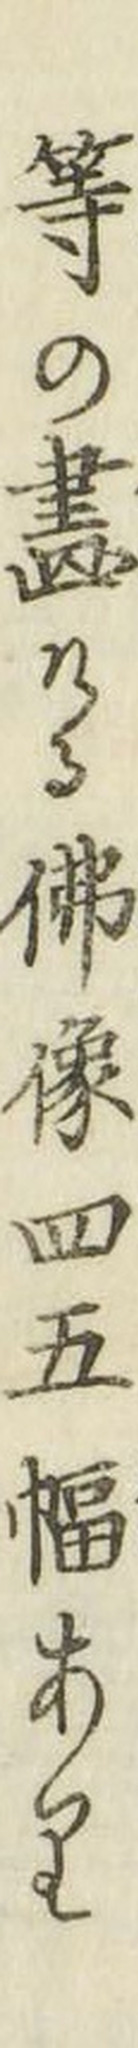等の畵ける佛像四五幅あり
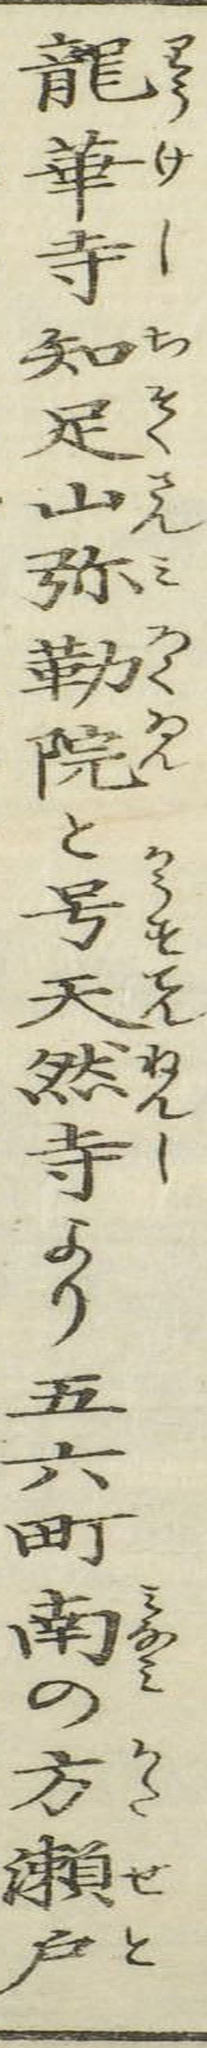龍華寺知足山弥勒院と号天然寺より五六町南の方瀬戸
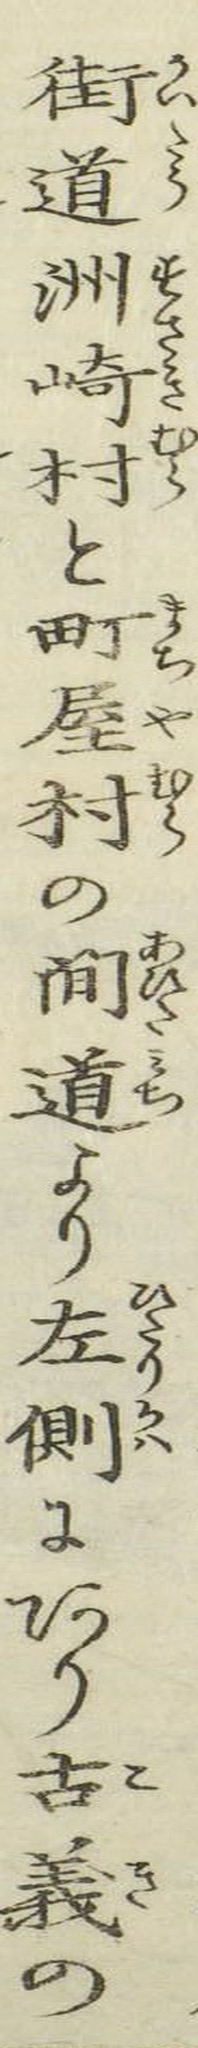街道洲崎村と町屋村の間道より左側にあり古義の
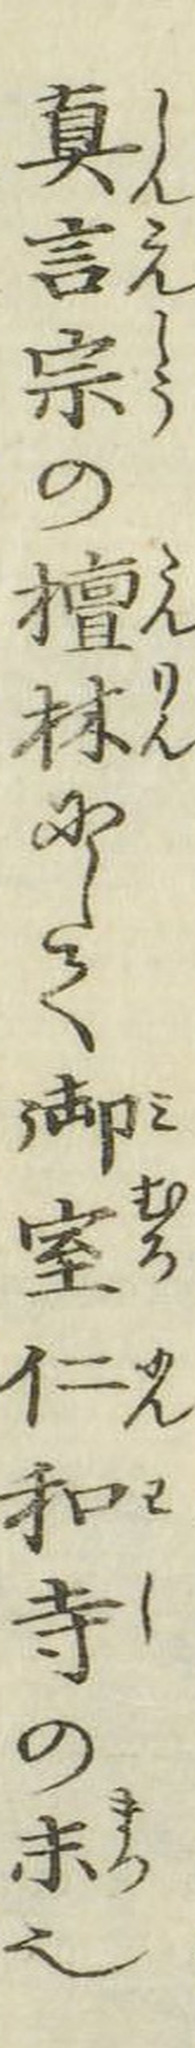真言宗の檀林にして御室仁和寺の末也
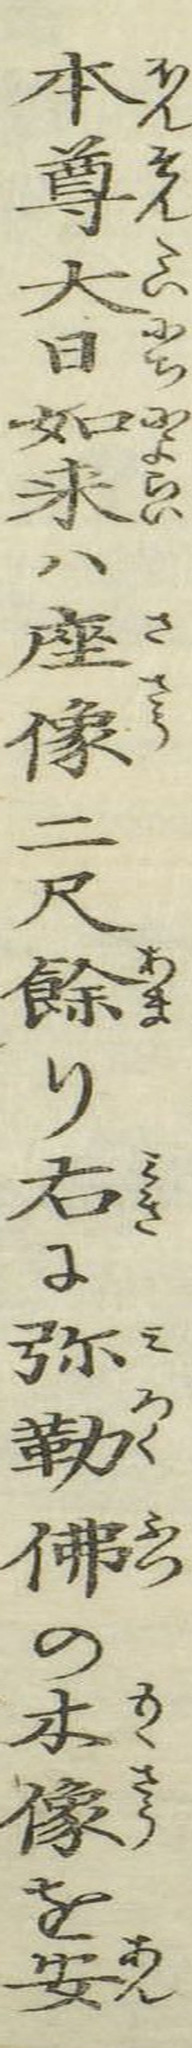本尊大日如来は座像二尺餘り右に弥勒佛の木像を安
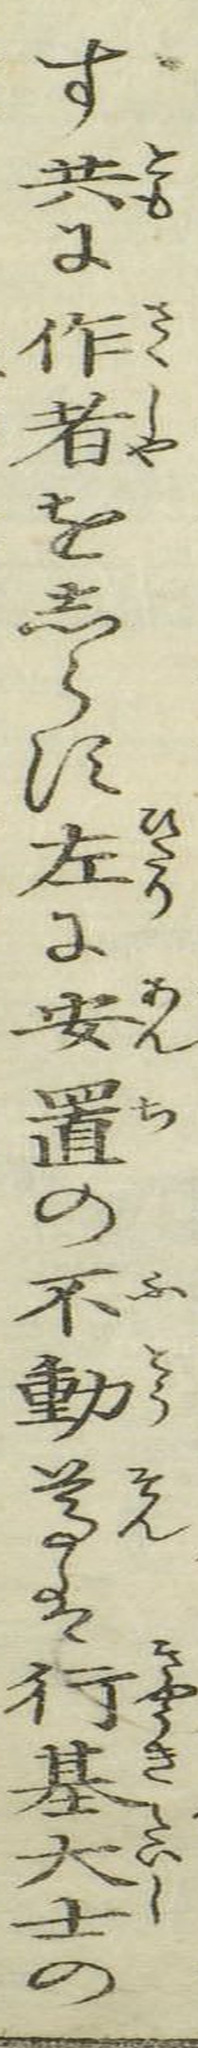す共に作者をしらす左に安置の不動尊は行基大士の

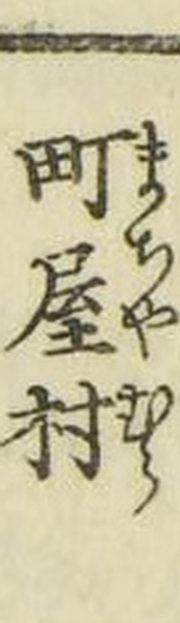町屋村
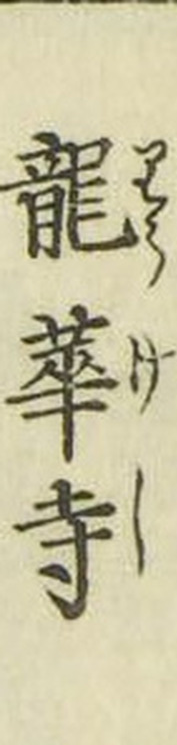龍華寺

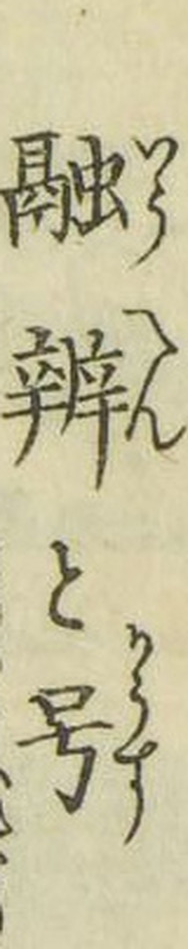融辨と号
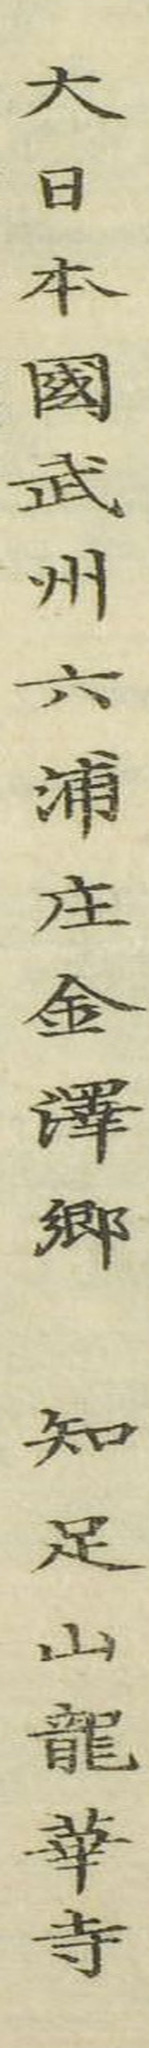大日本國武州六浦庄金澤郷知足山龍華寺
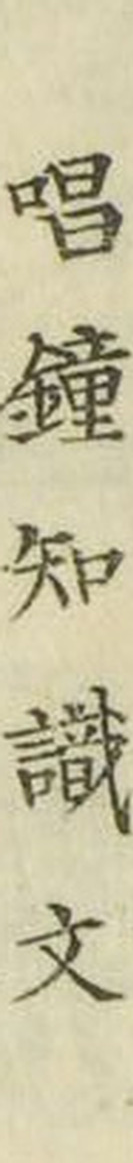唱鐘知識文
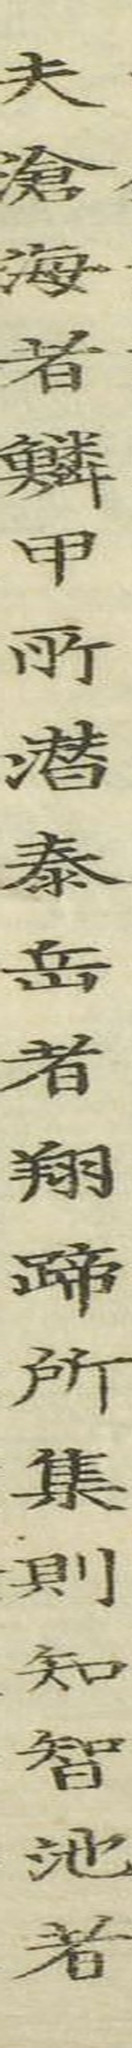夫滄海者鱗甲所潛泰岳者翔蹄所集則知智池者
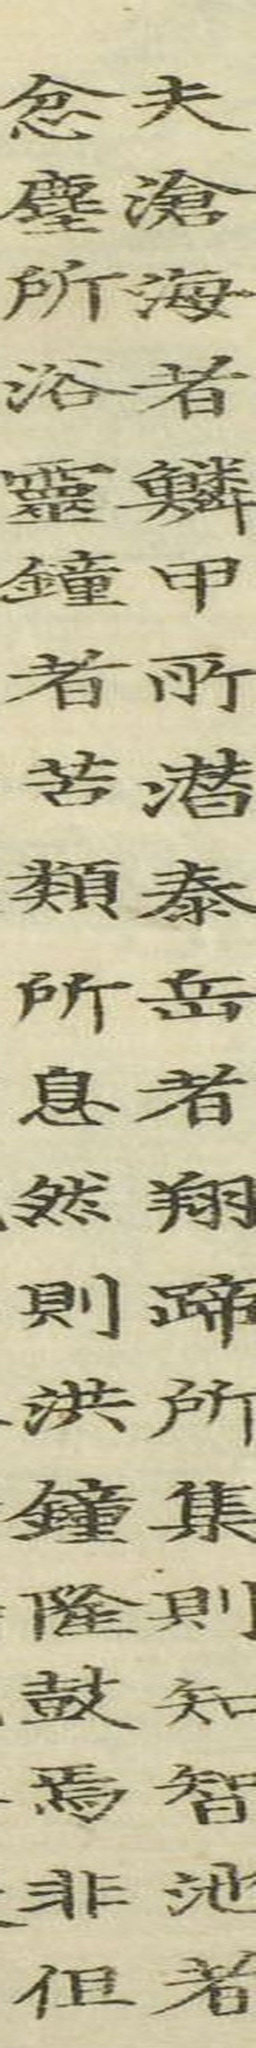忿塵所浴靈鐘者苦類所息然則洪鐘隆鼓焉非但
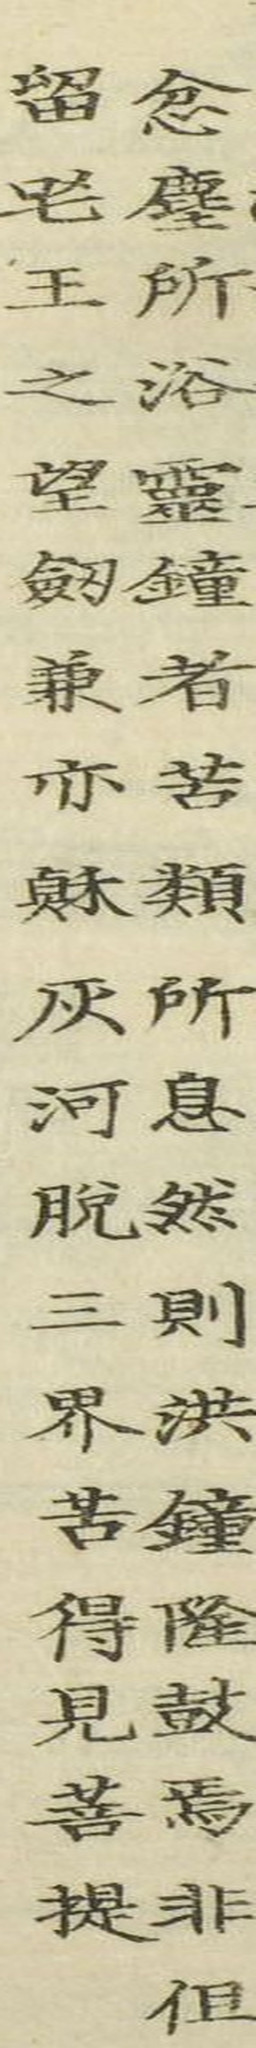留叱王之望劔兼亦𬓲灰河脫三界苦得見菩提
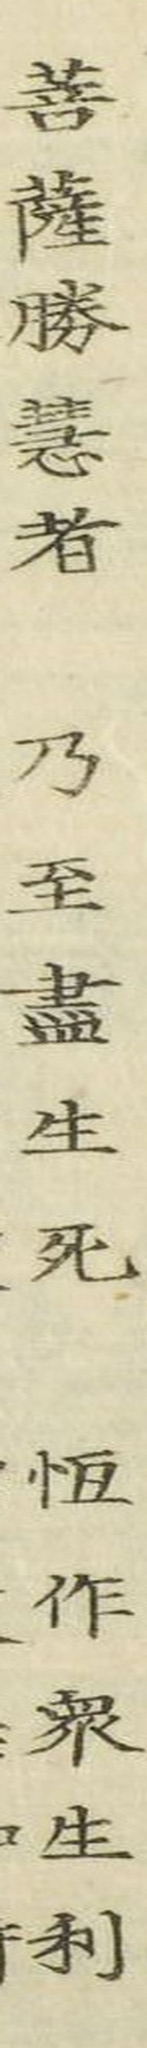菩薩勝慧者乃至盡生死恆作衆生利
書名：江戸名所図会 20巻 巻之6
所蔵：東京学芸大学教育コンテンツアーカイブ
